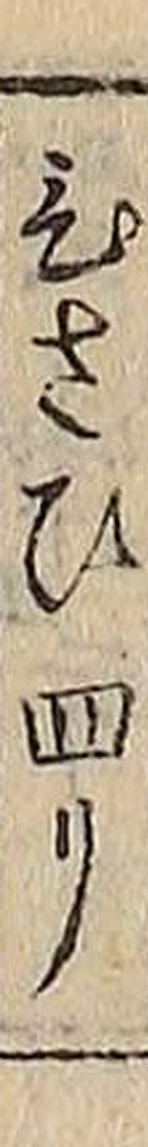ひさひ四リ
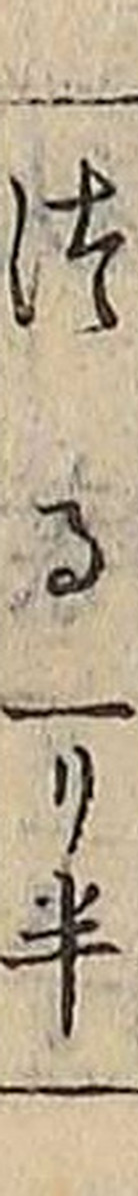つる一リ半
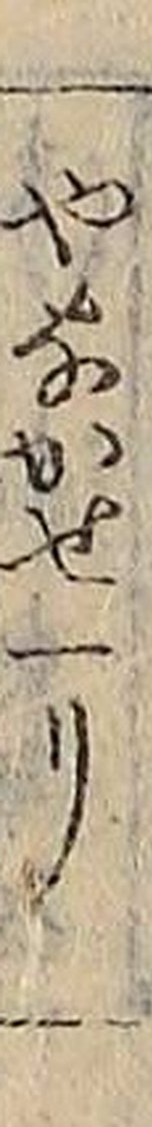やなかせ一リ
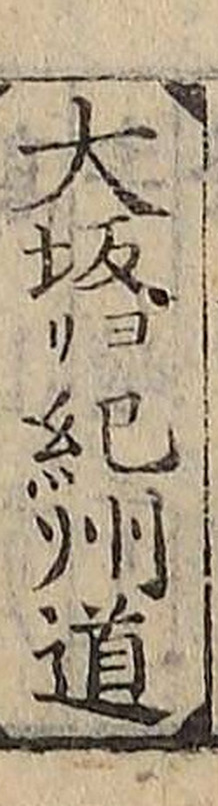大坂ヨリ紀州道
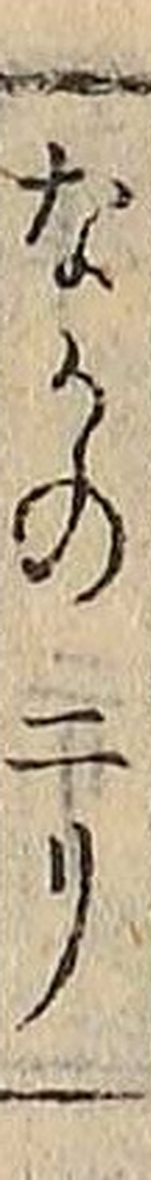なかの二リ
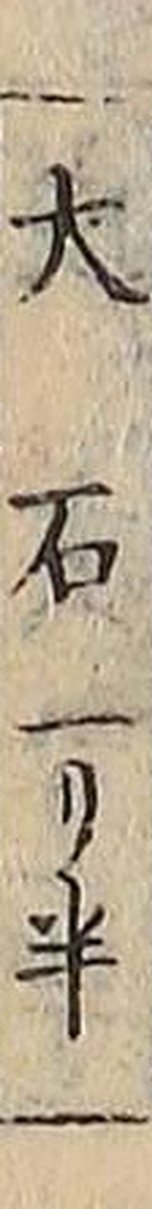大石一リ半
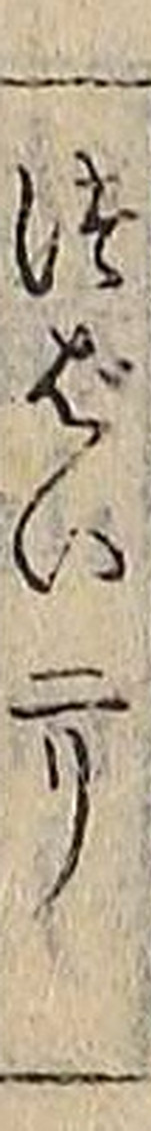つばい二リ
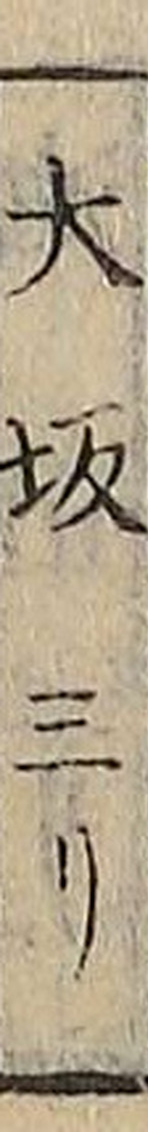大坂三リ
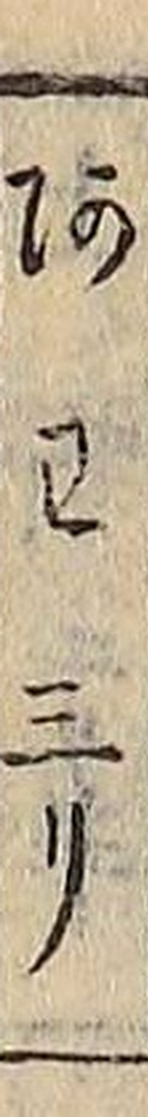あわ三リ
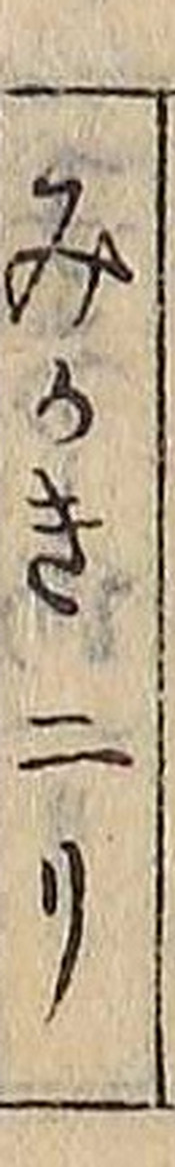みかき二リ
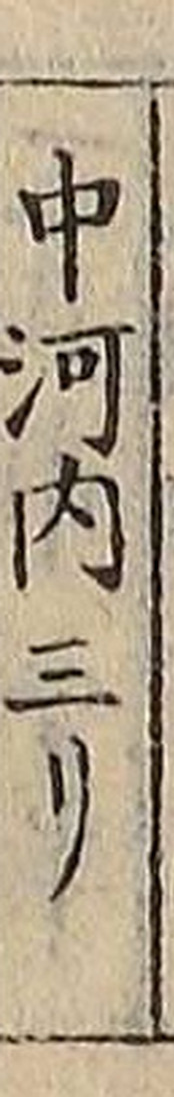中河内三リ
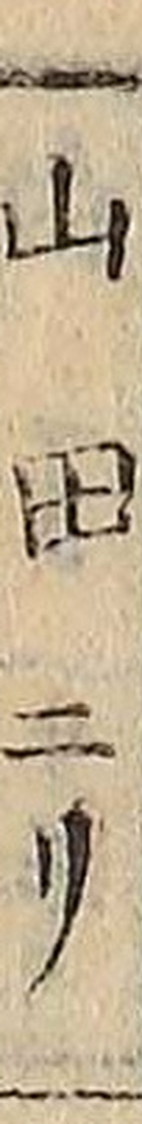山田二リ
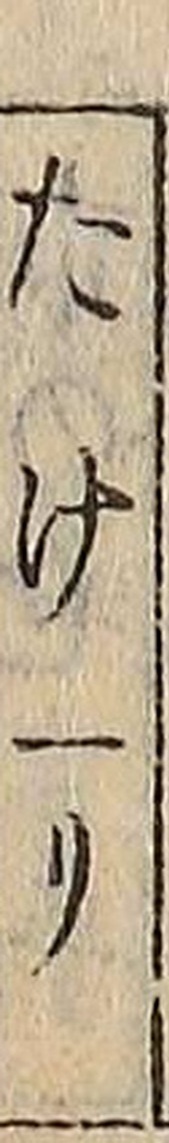たけ一リ
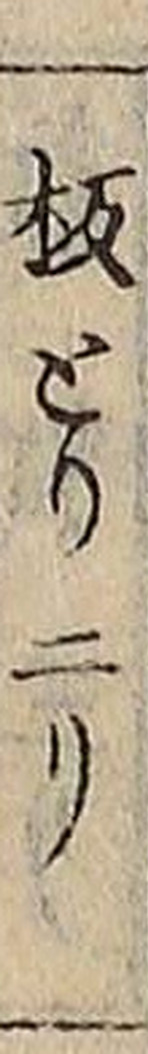板とり二リ
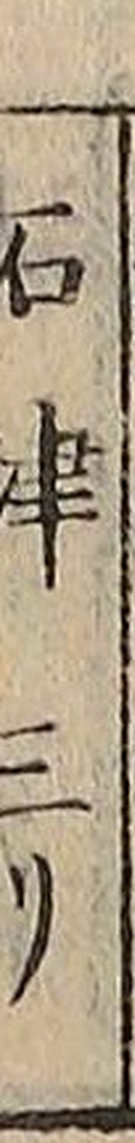石津三リ
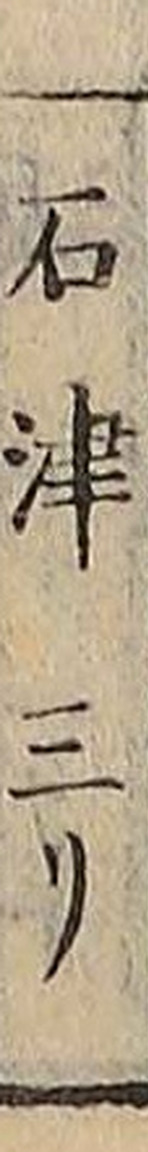石津三リ
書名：旅行用心集
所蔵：神戸大学附属図書館 国文学研究資料館
